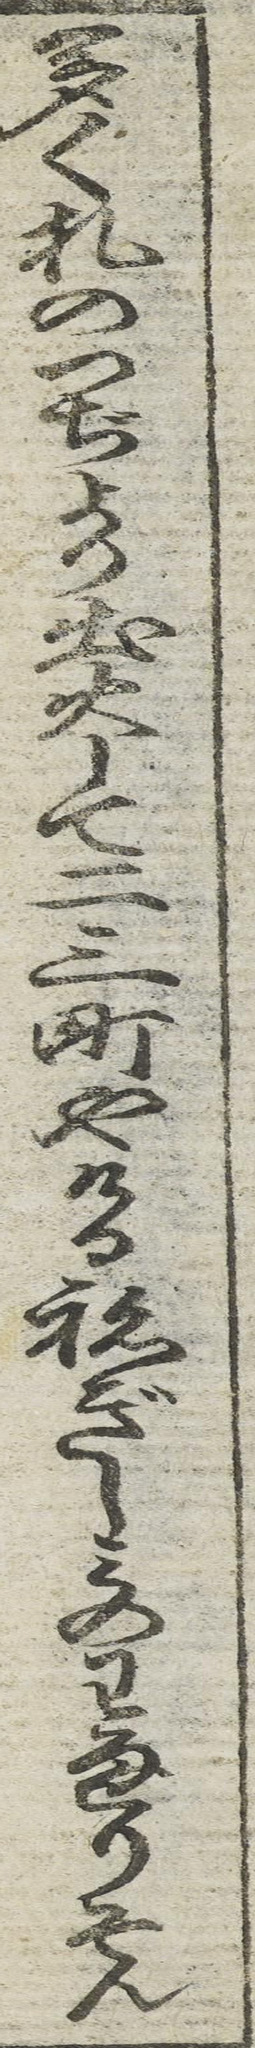多く札のつぢより出火して二三町やける根ぎしみのわ通りそん
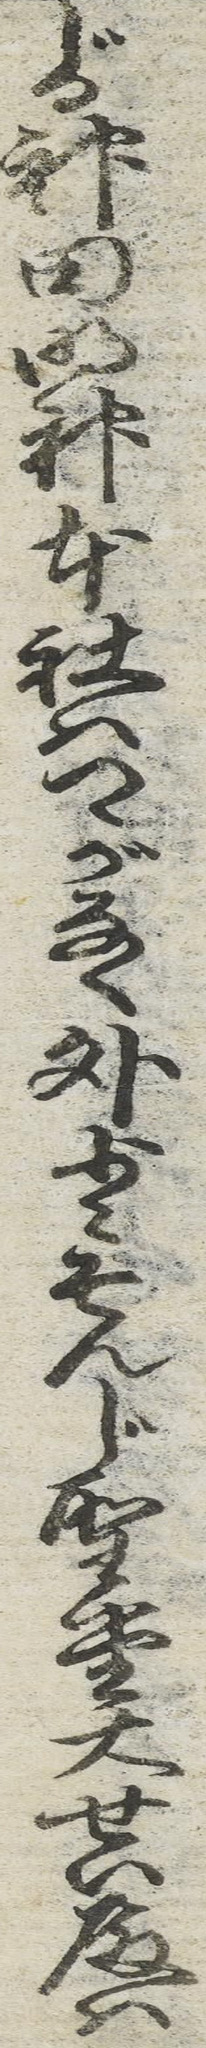じる神田明神本社はつゝがなく外少〻そんじ聖堂大せい殿は
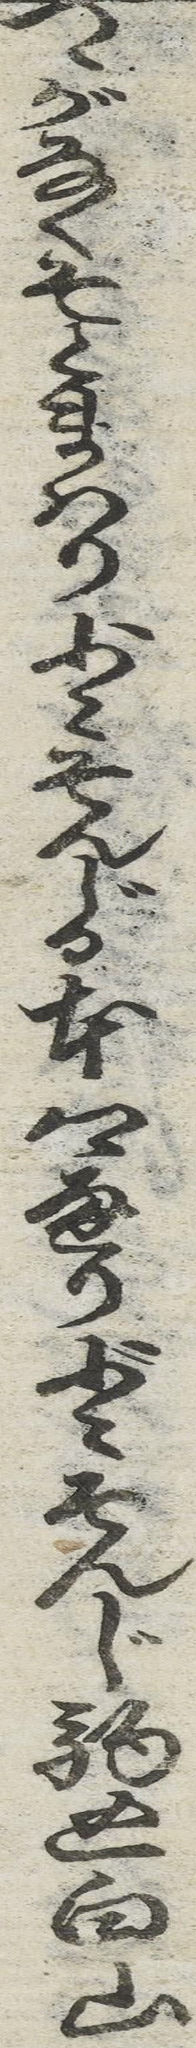つゝがなくそとまはり少〻そんじる本門通り少〻そんじ駒込白山
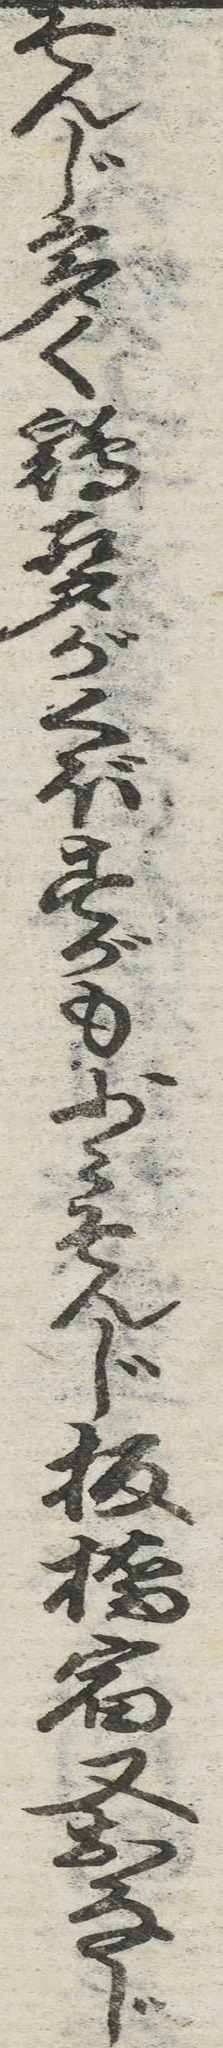そんじ多く鶏声がくぼすがも少〻そんじ板橋宿又おなじ
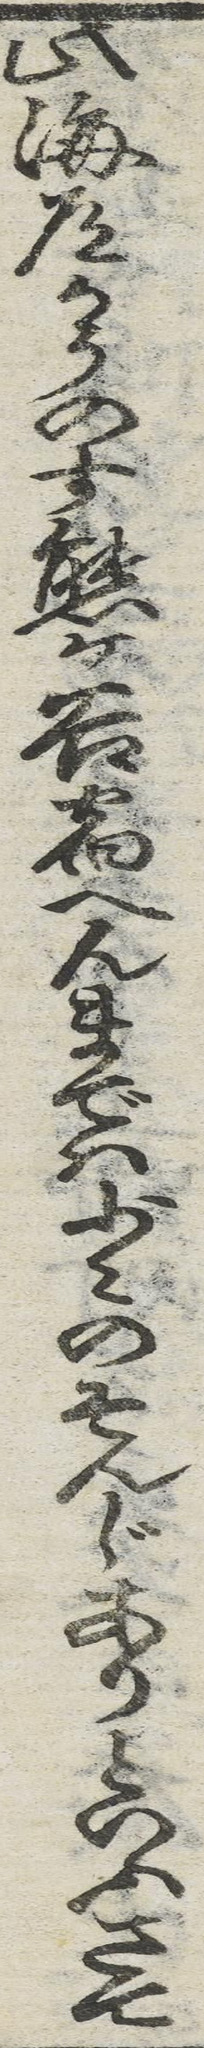此海道かうのす熊ヶ谷宿へんまでは少〻のそんじありといふさて
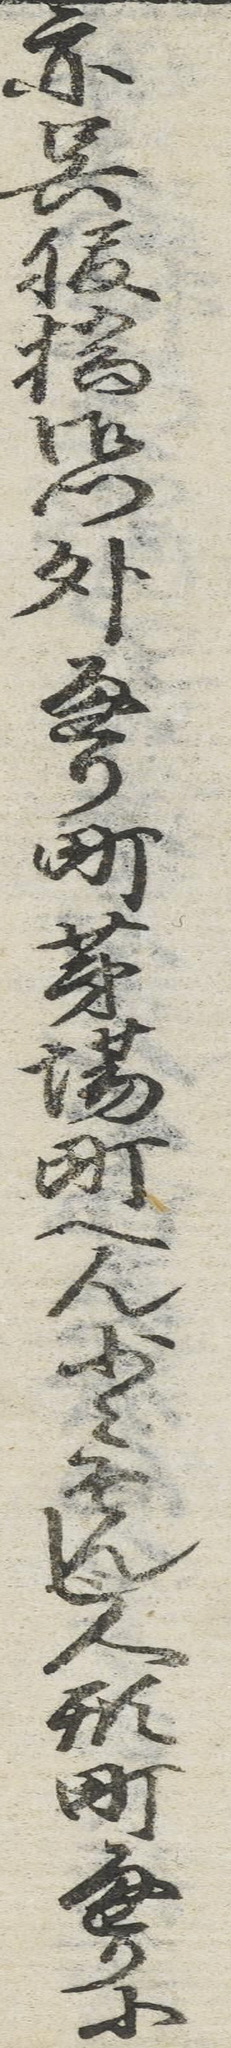亦呉服橋御門外通り町茅場町へん、少〻そんじ人形町通りに
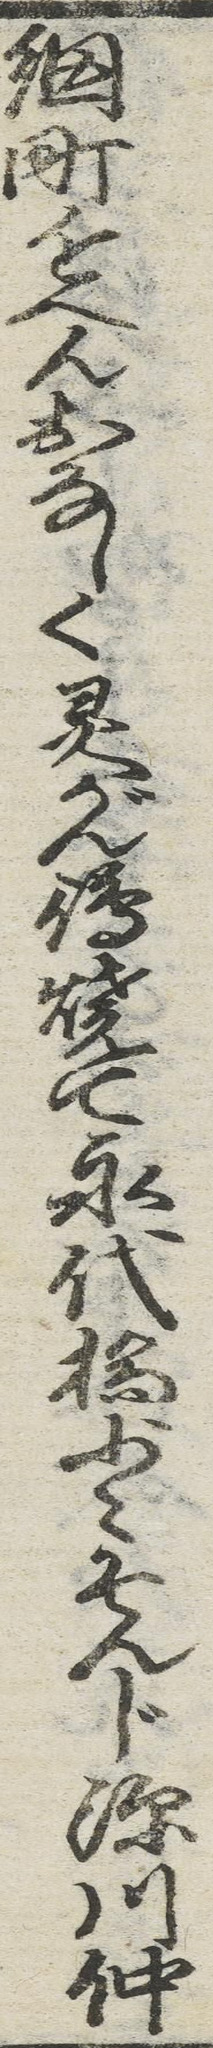細町近へんおなしく霊がん嶋焼て永代橋少〻そんじ深川仲
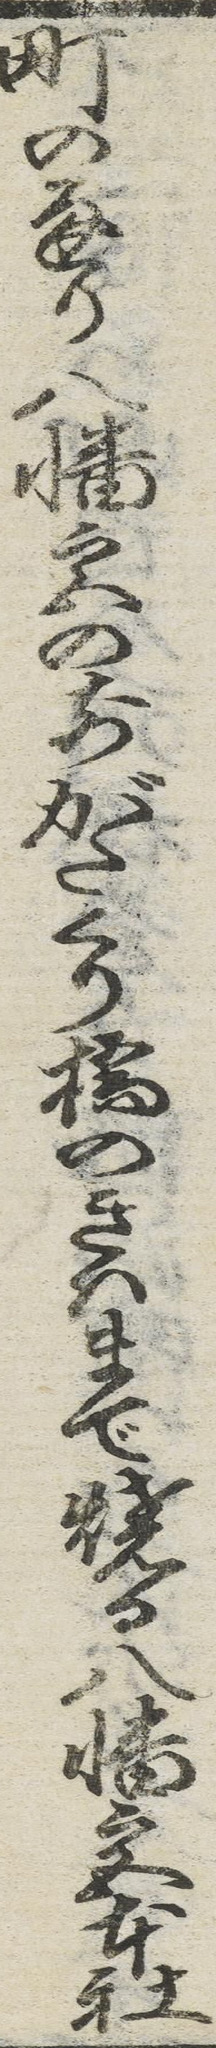町の通り八幡穴の前がたくり橋のきはまで焼る八幡宮本社
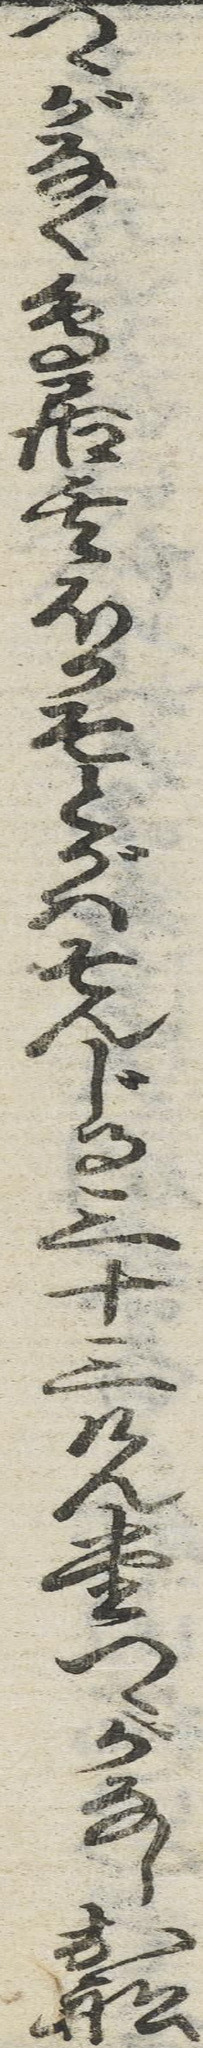つゝがなく鳥居其ほかそとがはそんじる三十三けん堂つゝがなしお船
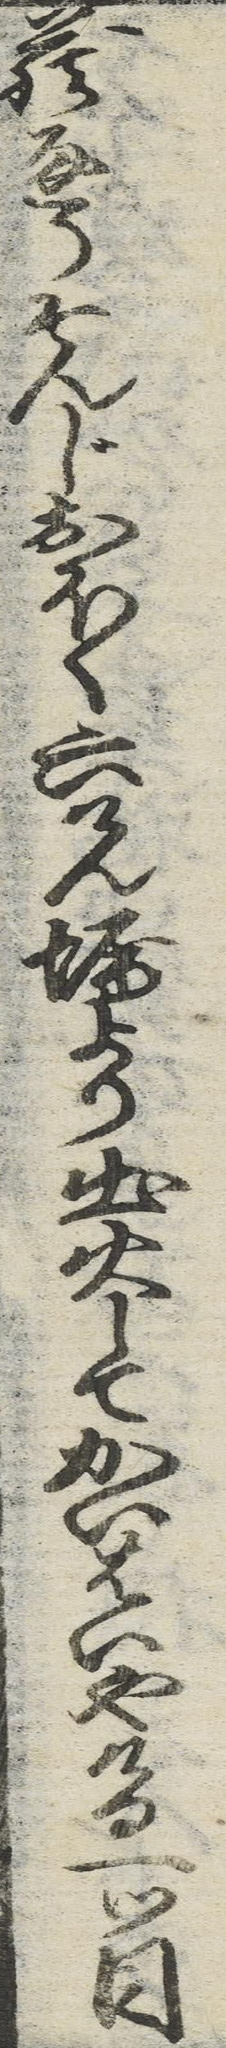蔵通りほんじおほく六けん堀より出火してかいはいやける一つ目
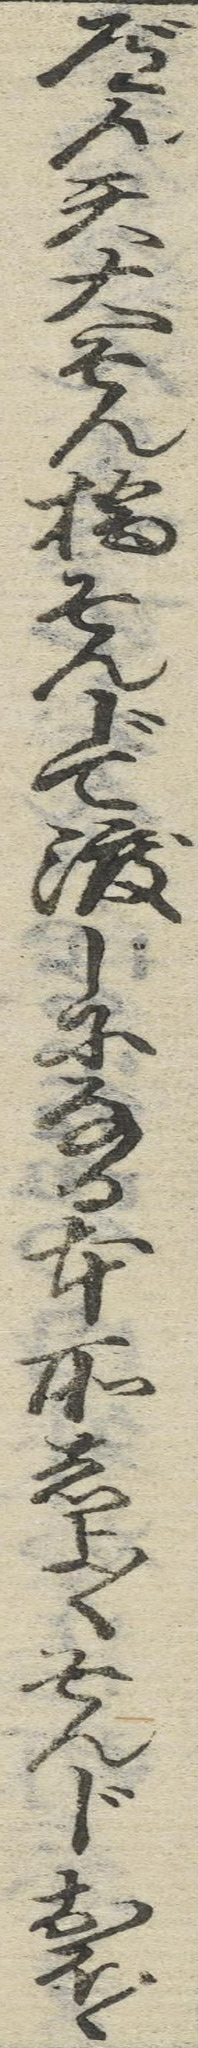べん天大そん橋そんじて渡しになる本所しよ〳〵そんじおほく
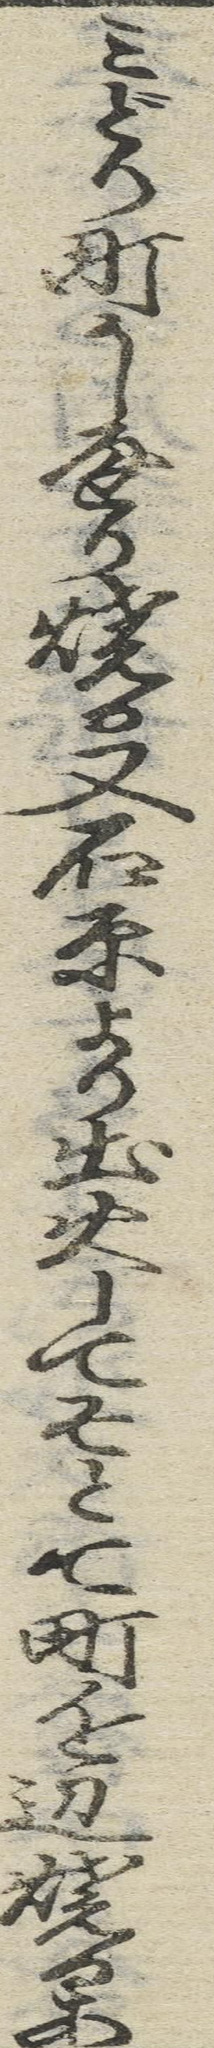みどり町かし通り焼る又石原より出火してそとて町近辺焼るあ
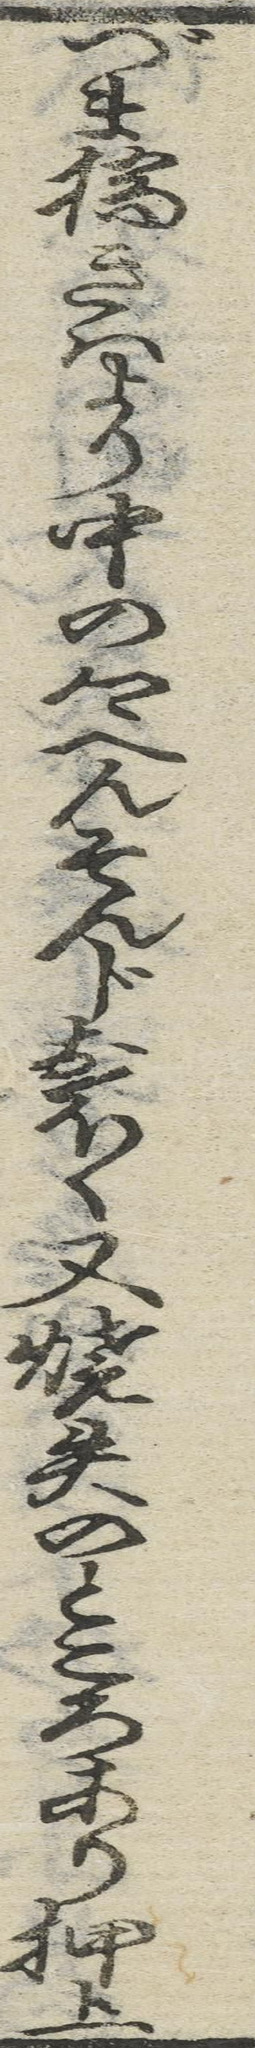づま橋きはより中の門へんそんじおほく又焼失のところあり押上
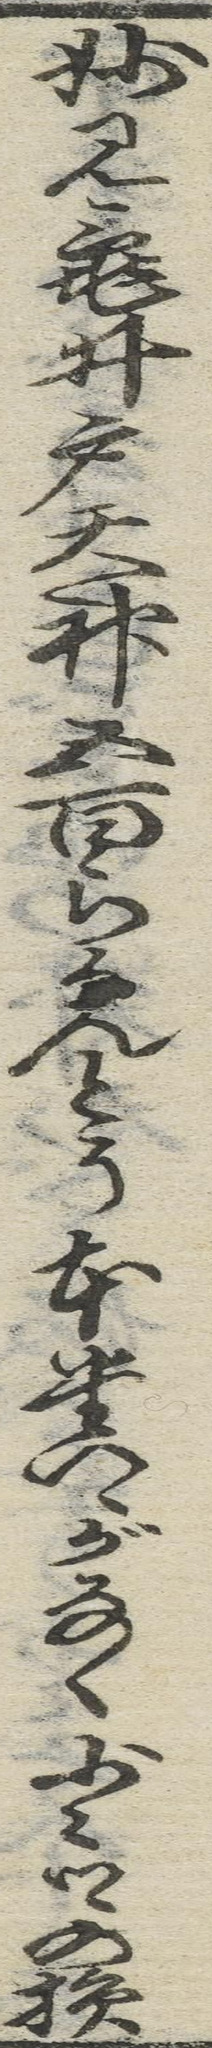妙見亀井戸天神五百らかんとう本堂つゝがなく少〻門の損
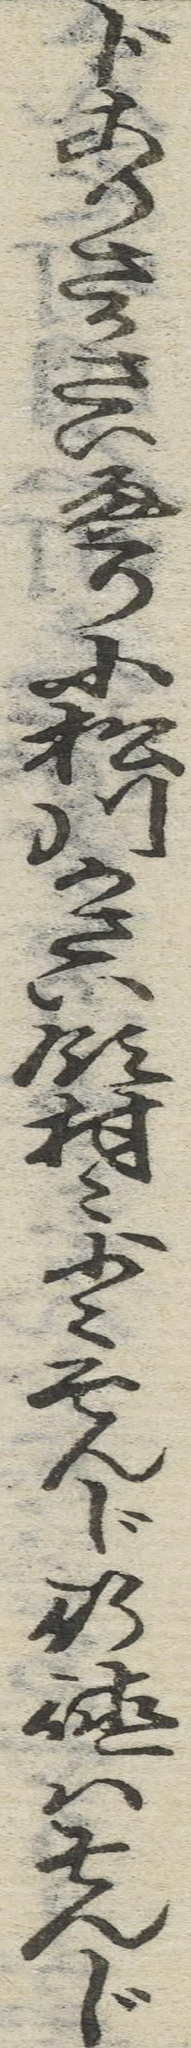じありさかさい通り小松川かさい領村〻少〻そんじ行徳はそんじ
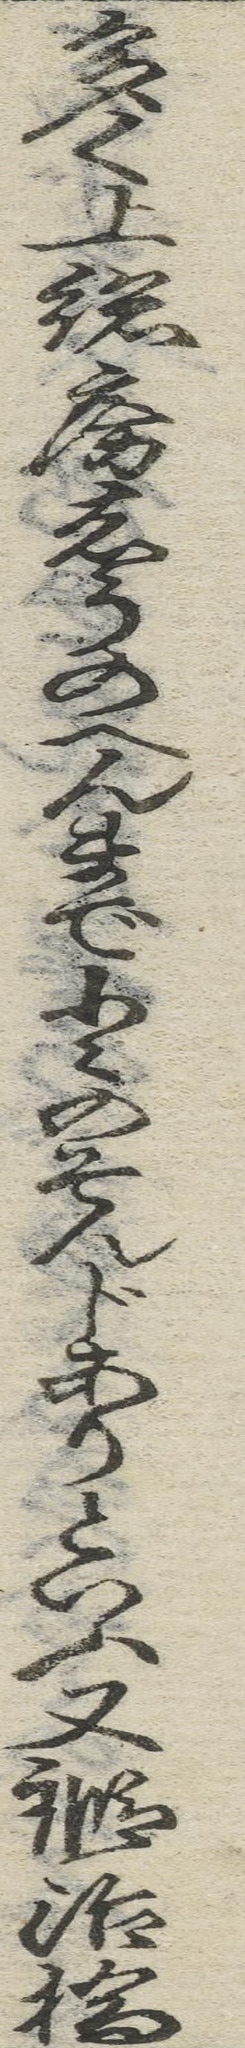多く上総房しうのへんまで少〻のそんじありといふ又鍛冶橋
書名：関東　大地震細記
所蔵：東京大学地震研究所図書室 Earthquake Research Institute Library, The University of Tokyo, JAPAN
